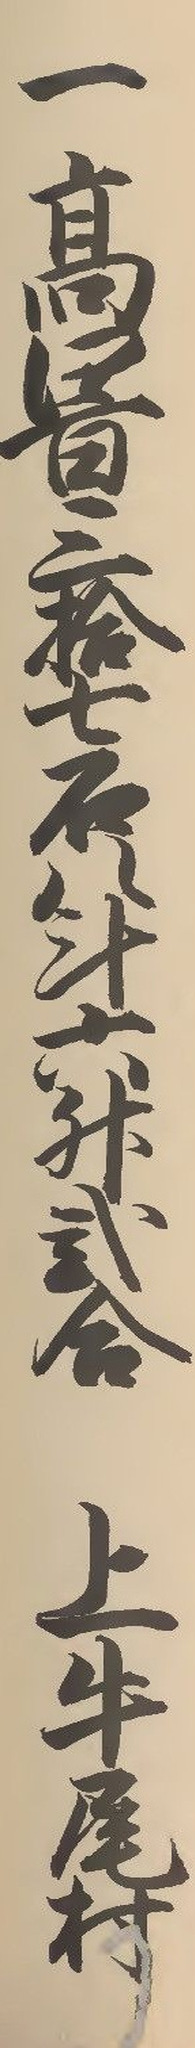一髙四百三拾七石八斗六升弐合上牛尾村
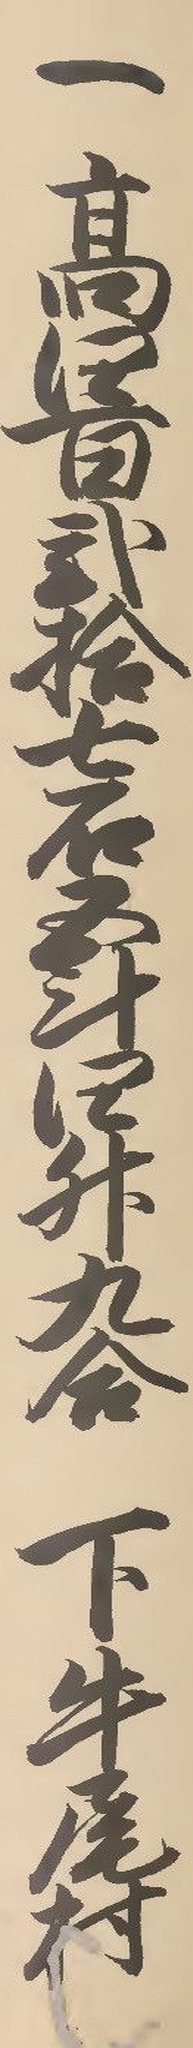一髙四百弐拾七石五斗四升九合下牛尾村
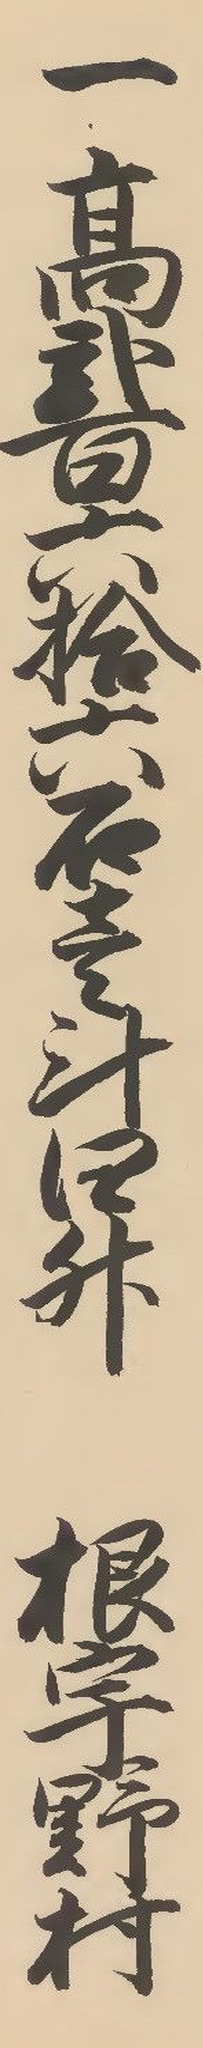一髙弐百六拾六石壱斗四升根宇野村
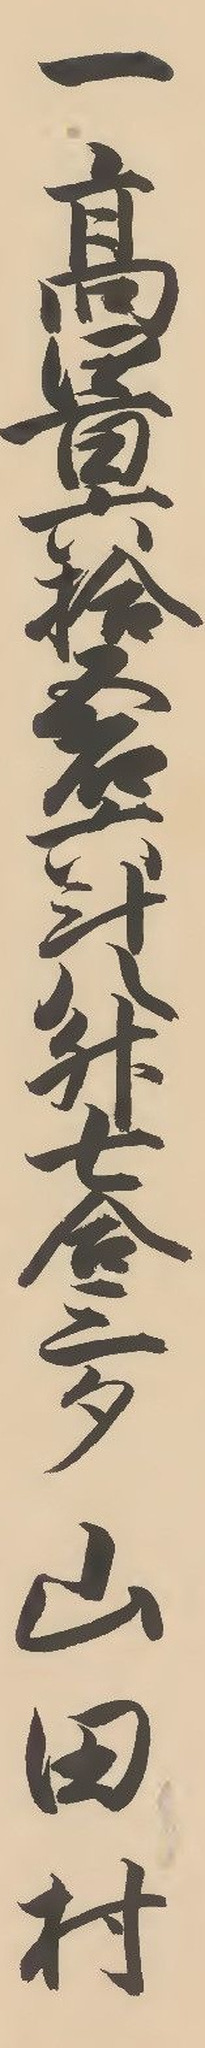一髙四百六拾五石六斗八升七合三夕山田村
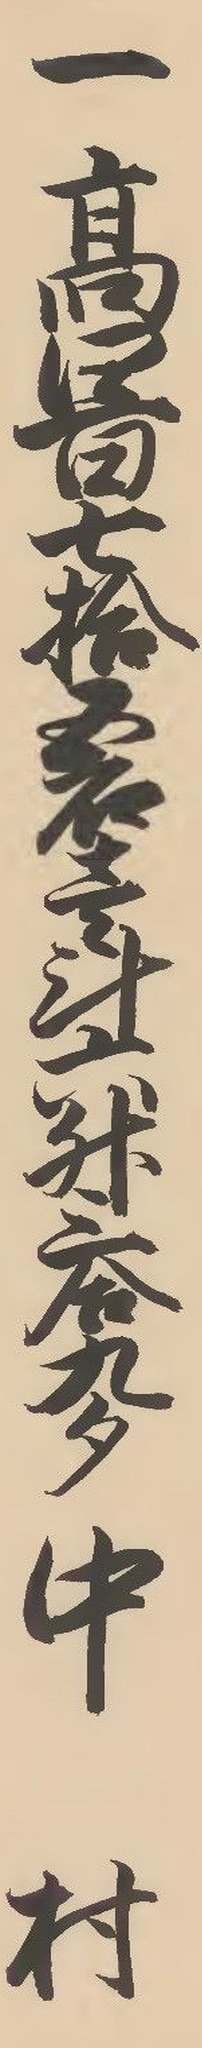一髙四百七拾五石壱斗六升三合九夕中村

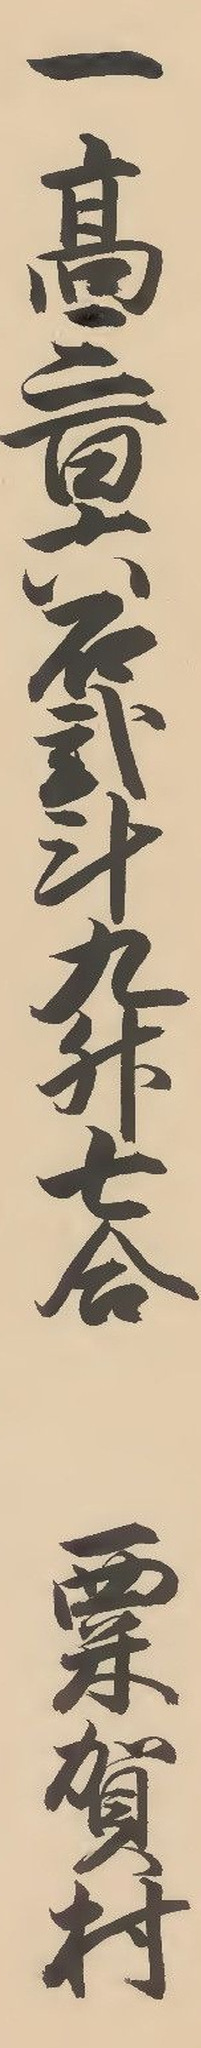一髙三百六石弐斗九升七合粟賀村
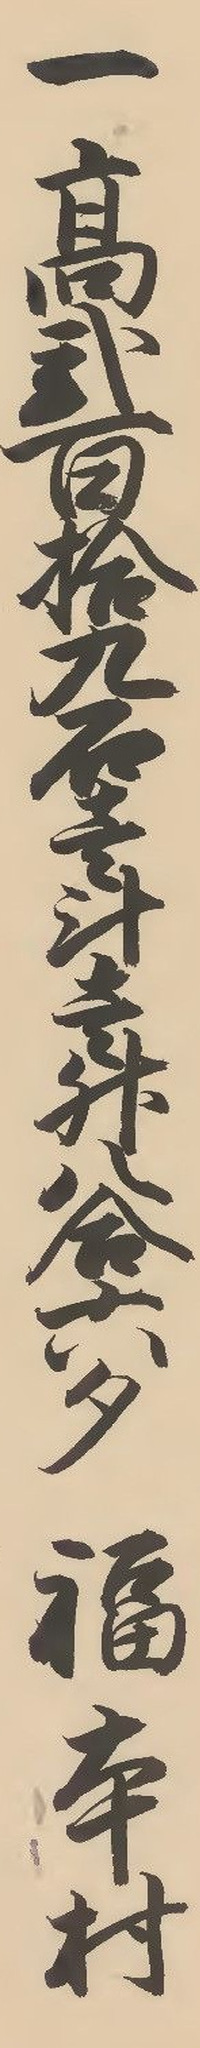一髙弐百拾九石壱斗壱升八合六夕福本村
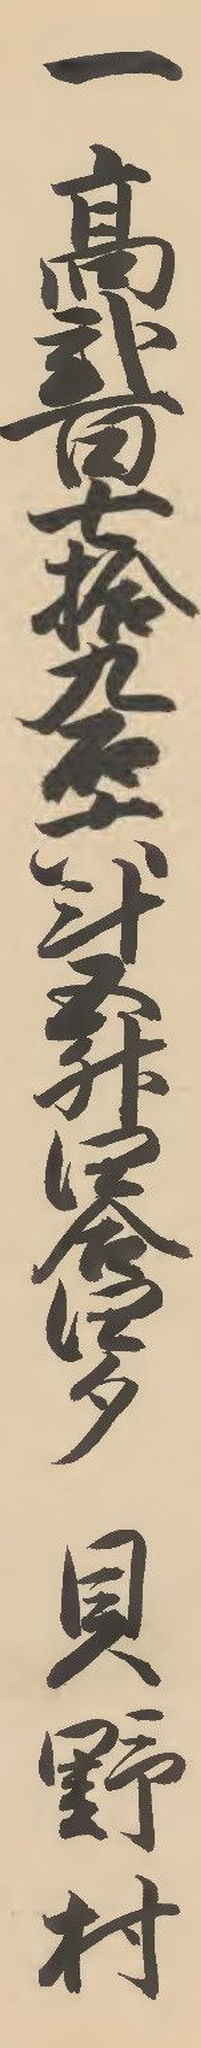一髙弐百七拾九石六斗五升四合四夕貝野村
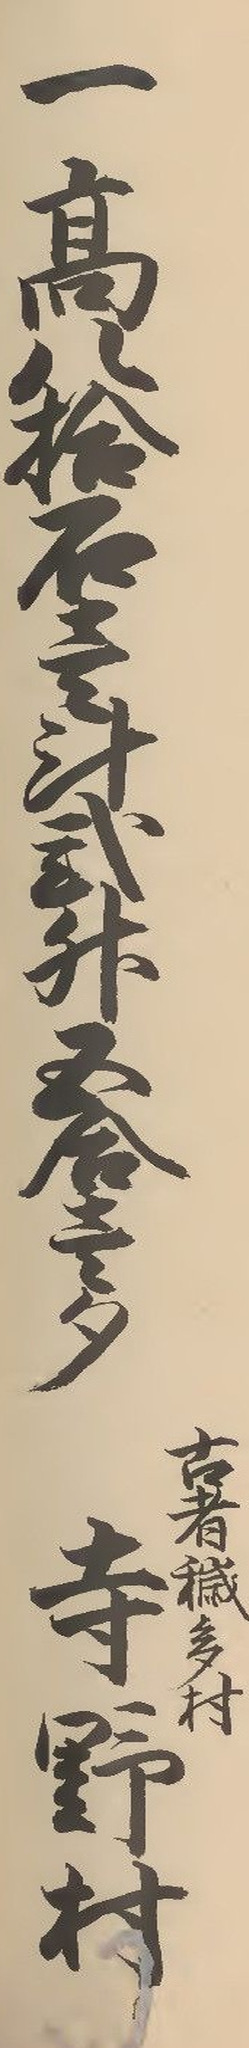一髙八拾石壱斗弐升五合壱夕寺野村
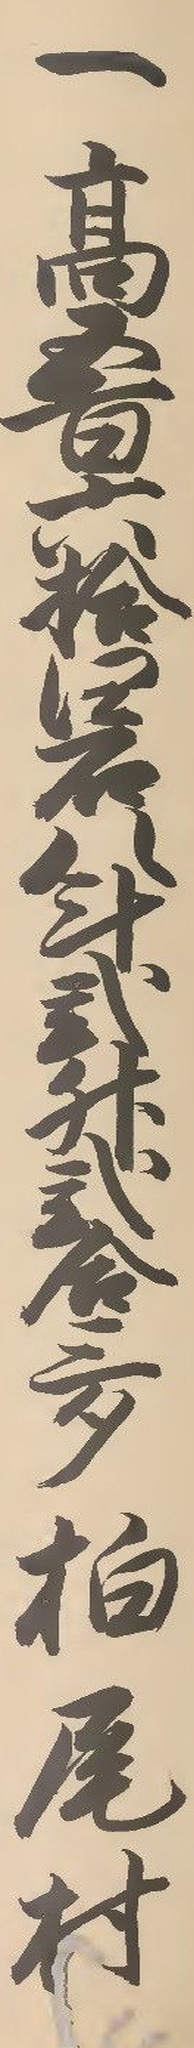一髙五百六拾四石八斗弐升弐合三夕柏尾村
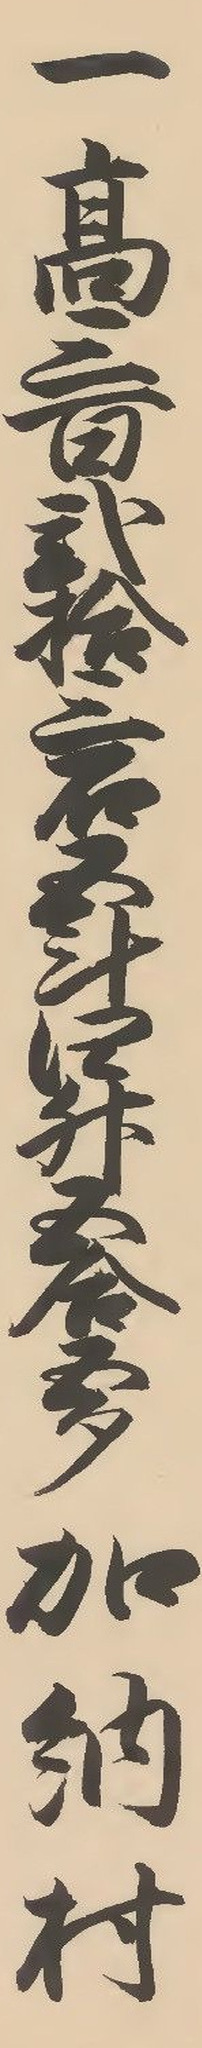一髙三百弐拾三石五斗四升五合五夕加納村
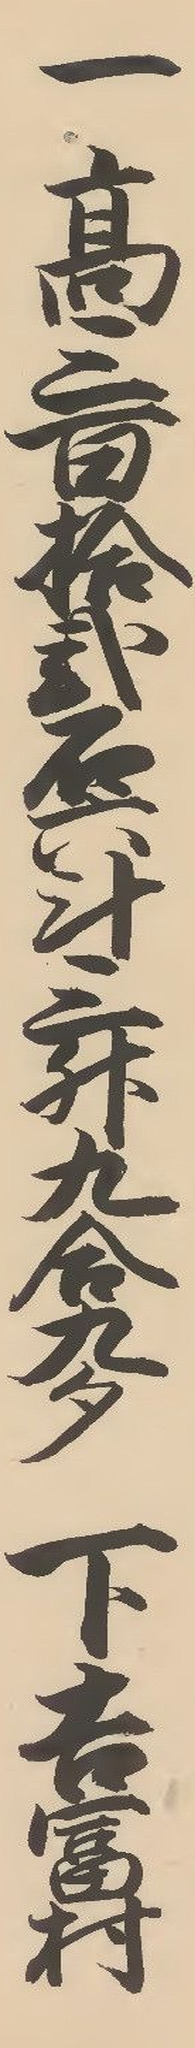一髙三百拾弐石六斗三升九合九夕下吉富村
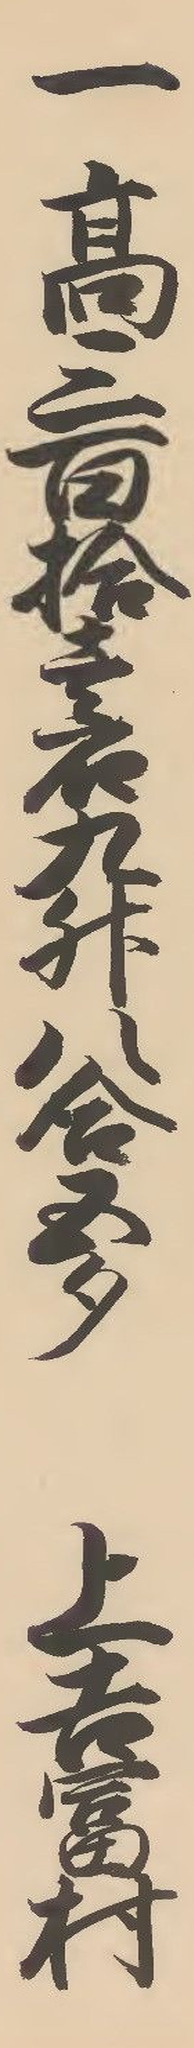一髙三百拾壱石九升八合五夕上吉冨村

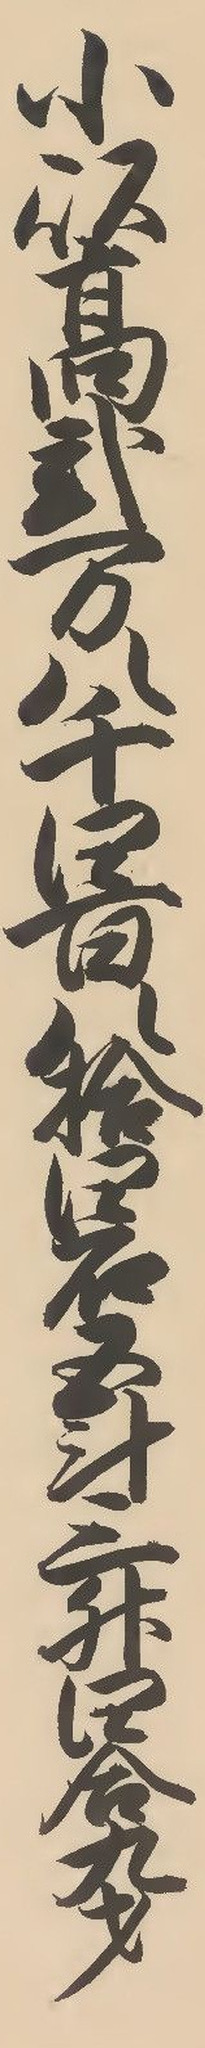小以髙弐万八千四百八拾四石五斗三升四合九才
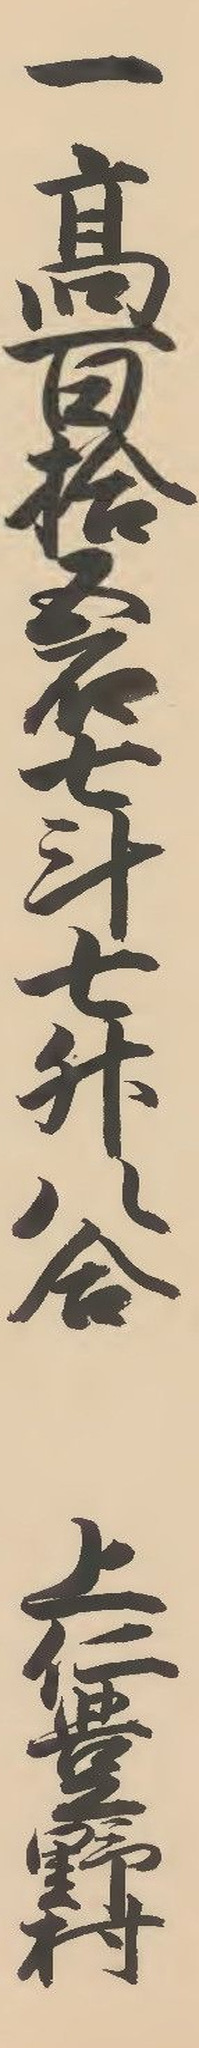一髙百拾五石七斗七升八合上仁豊野村
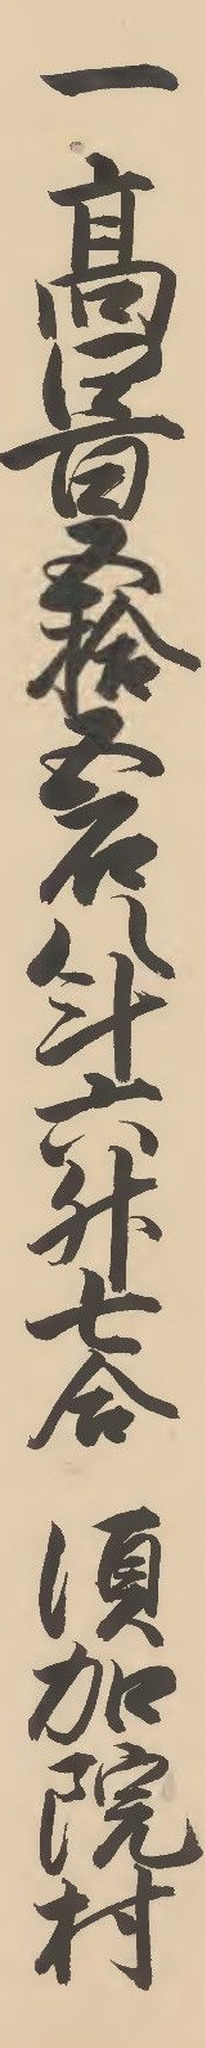一髙四百五拾五石八斗六升七合須加院村
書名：播磨国郷帳
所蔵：国立公文書館 National Archives of Japan
